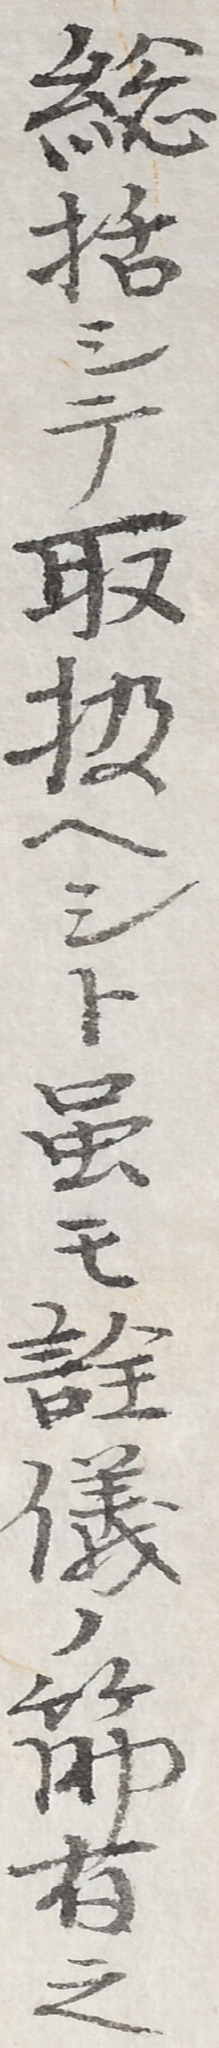総括シテ取扱ヘシト雖モ詮儀ノ筋有之
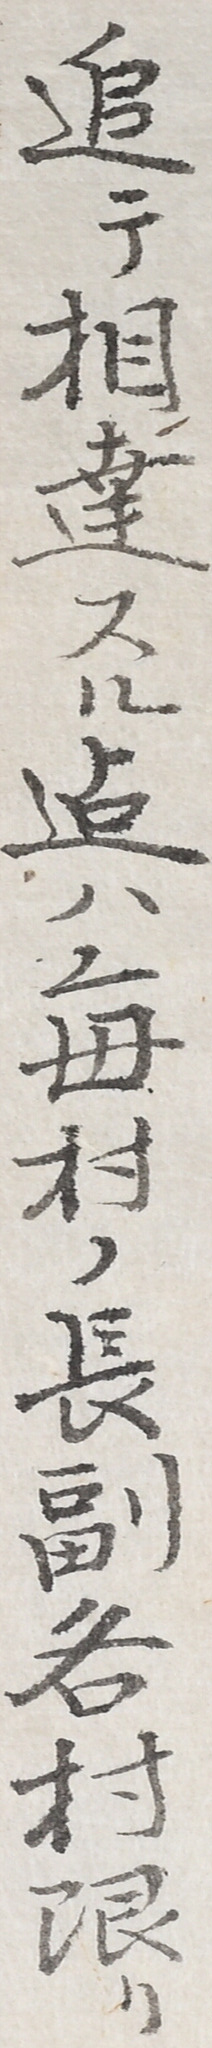追テ相達スル迄ハ毎村ノ長副各村限リ
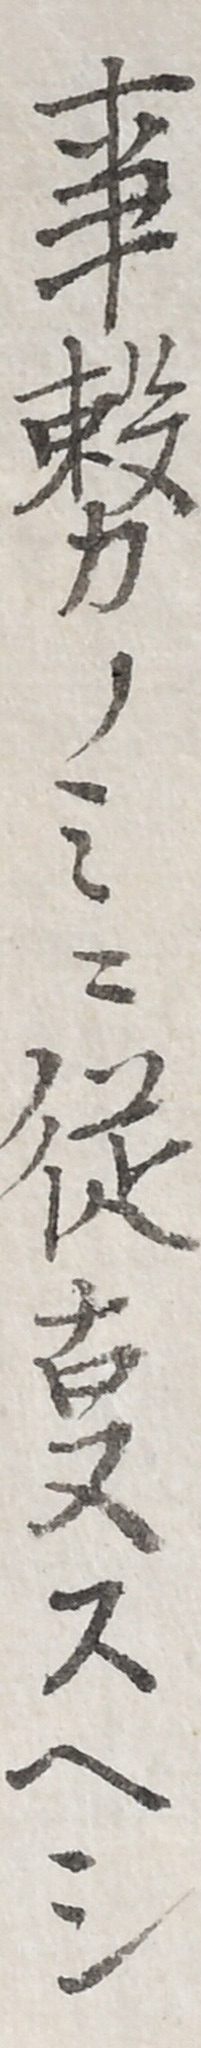事務ノミニ従事スヘシ
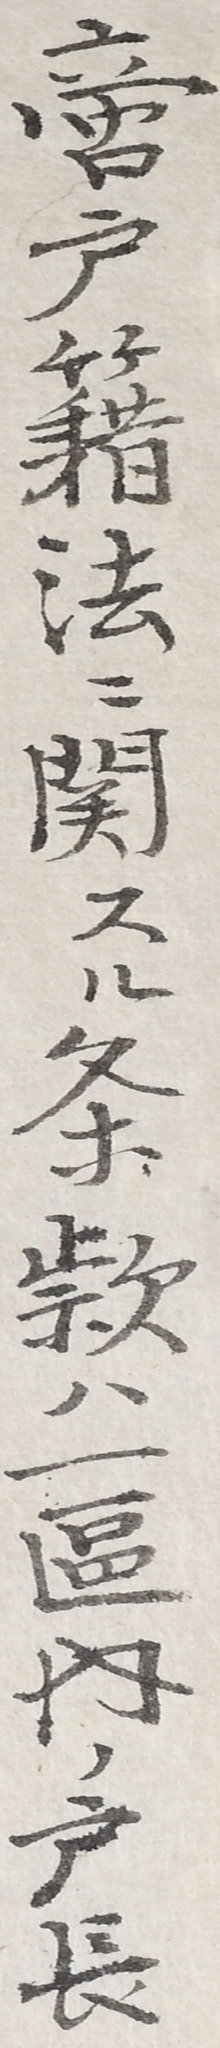啻戸籍法ニ関スル条款ハ一区内ノ戸長
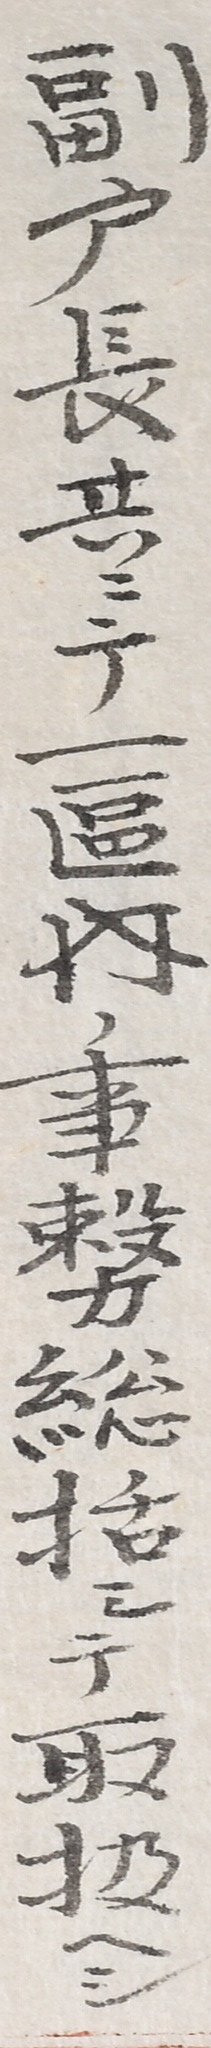副戸長共ニテ一区内ノ事務総括シテ取扱ヘシ
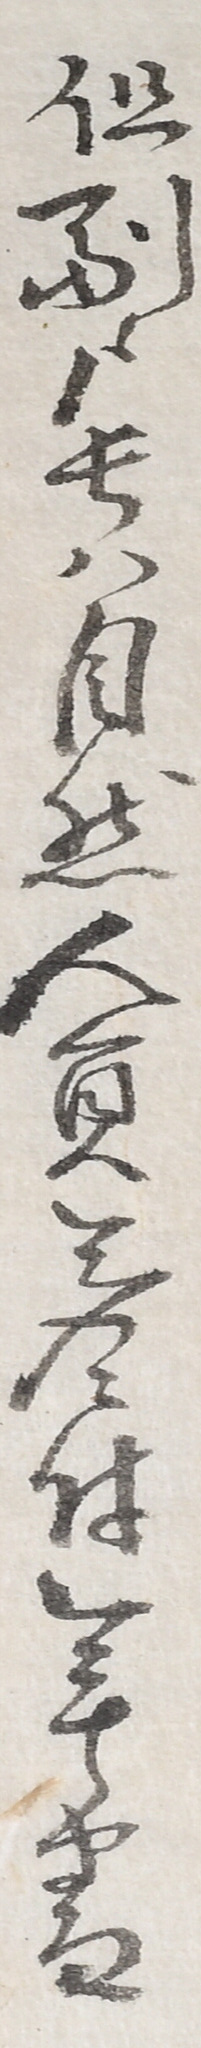但副戸長ハ自然人員多ニ付年番
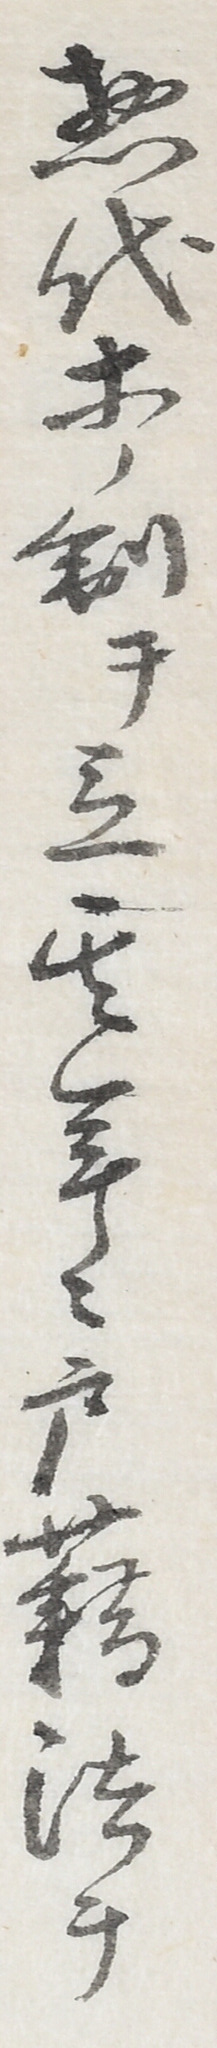総代等ノ制ヲ立其年ニ戸籍法ヲ
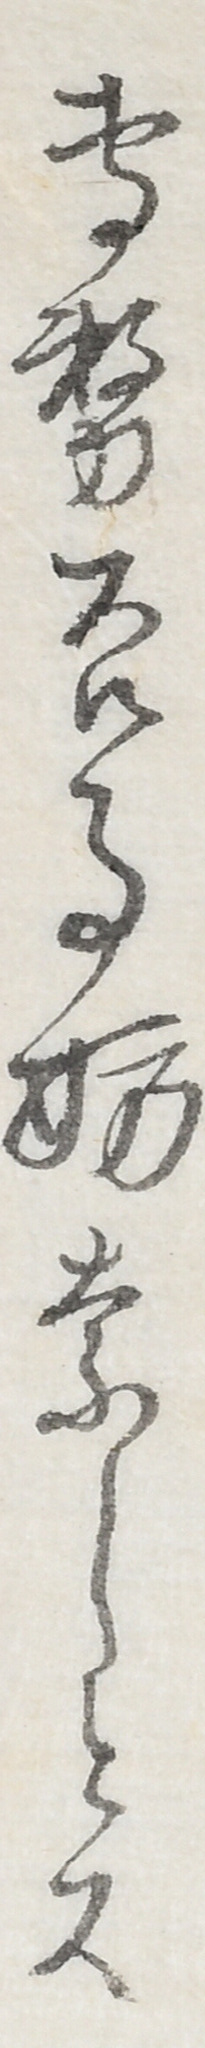専務スル事妨なしとス
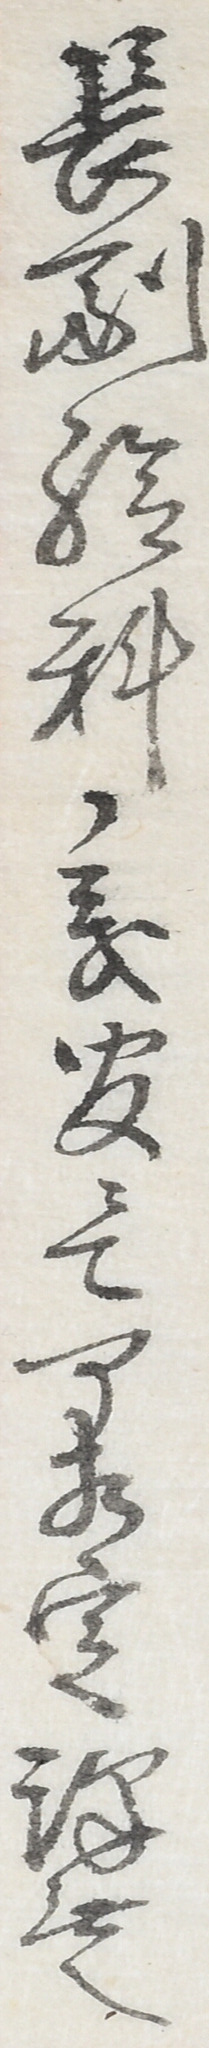長副給料ノ義官にて可相定訳無
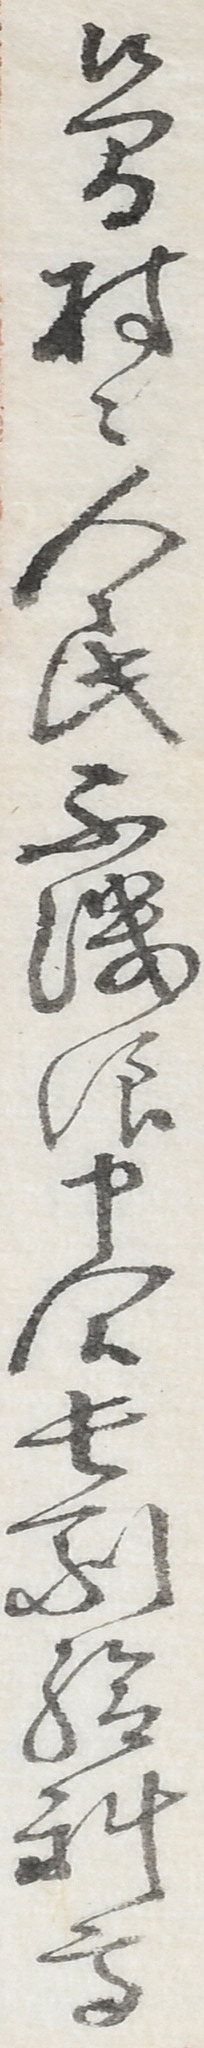候間村々人民不洩様申合長副給料高
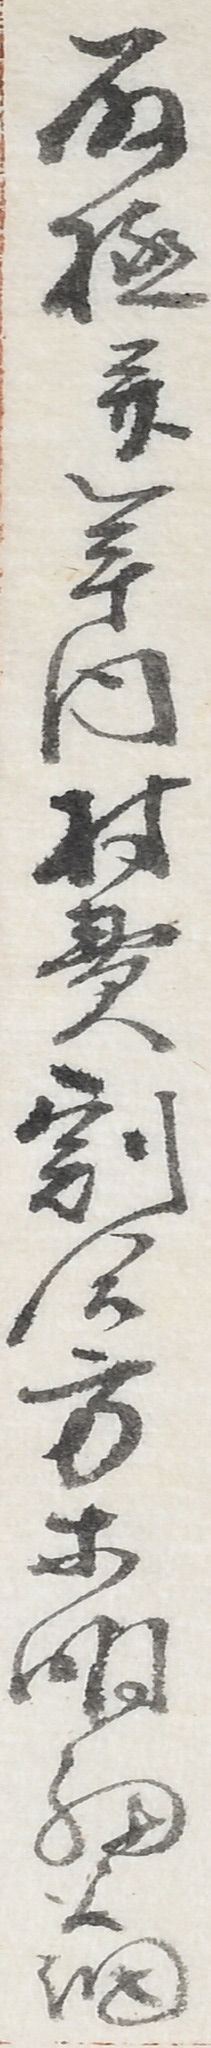取極幷年内村費割合方等明細取調
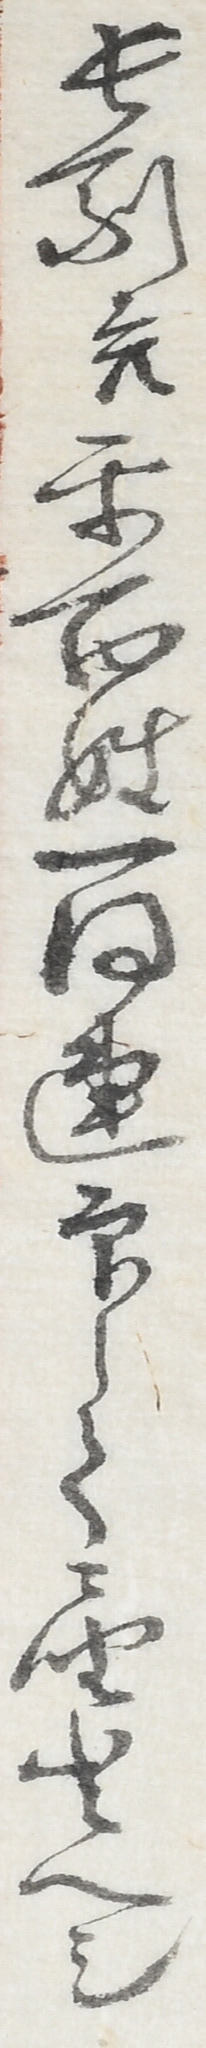長副共平百姓一同連印して届出ヘシ
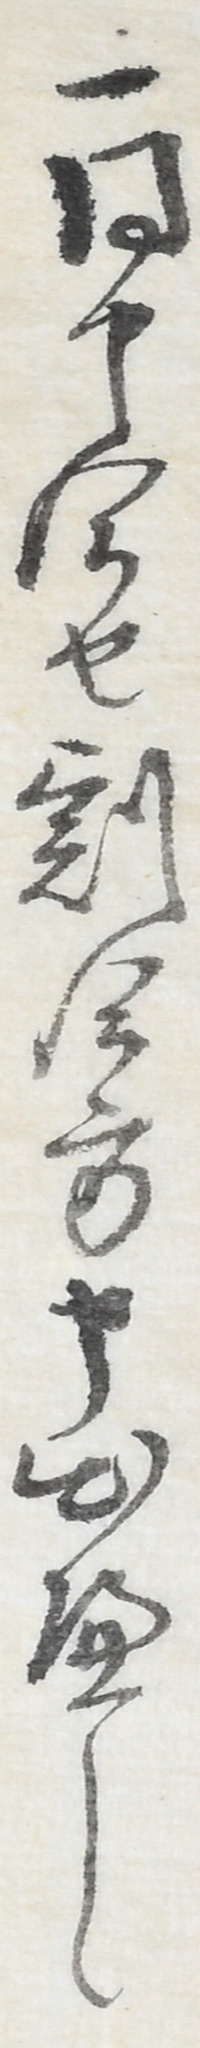一同申合セ割合方申出へし

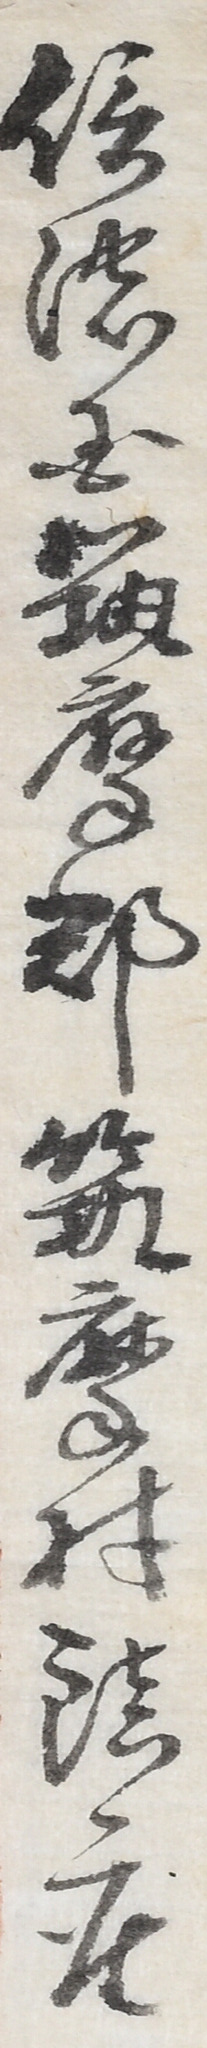信濃国筑摩郡筑摩村鎮座
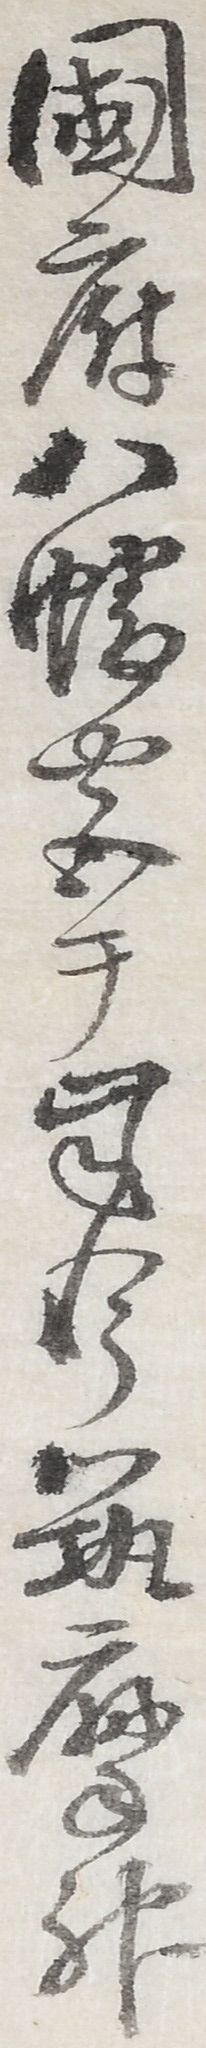国府八幡宮ヲ自今筑摩神
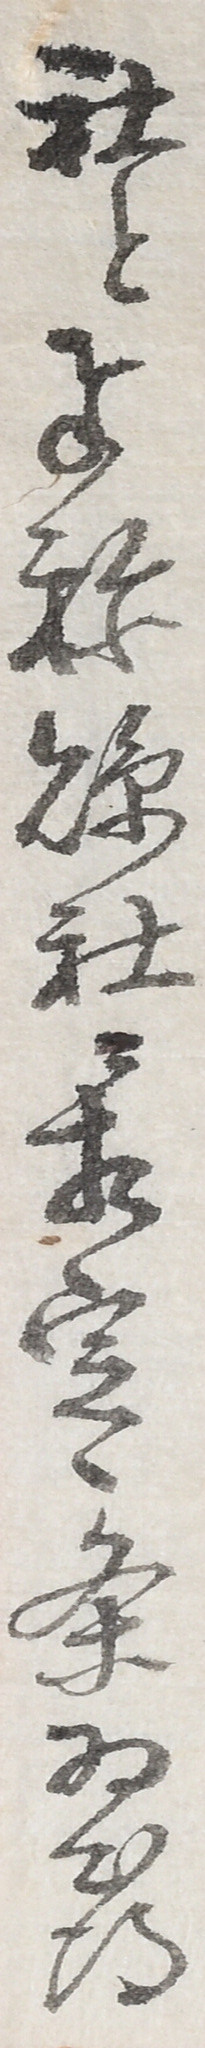社と奉称県社ニ相定候条為心得
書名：壹番・御布告一式
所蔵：伊那市立高遠町図書館・合同会社AMANE
